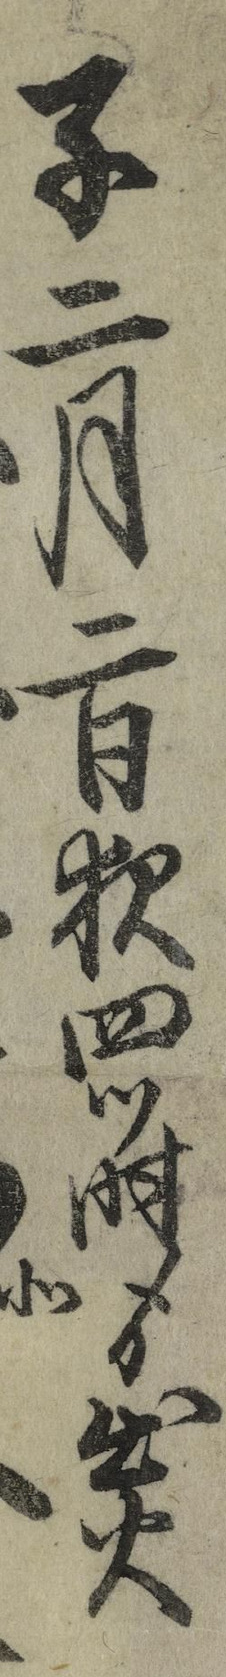子二月二日夜四ツ時ゟ出火
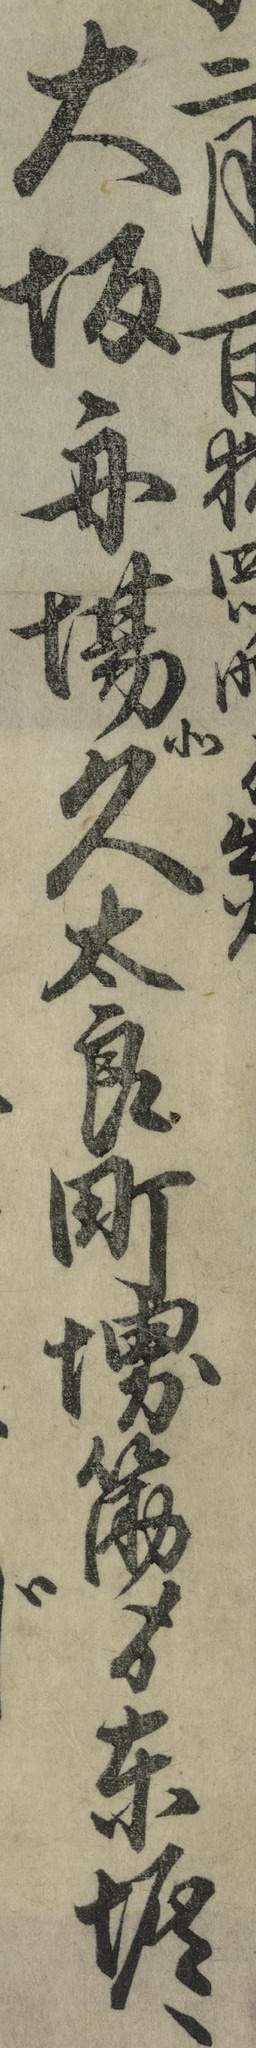大坂舟場北久太良町堺筋ゟ東堀へ
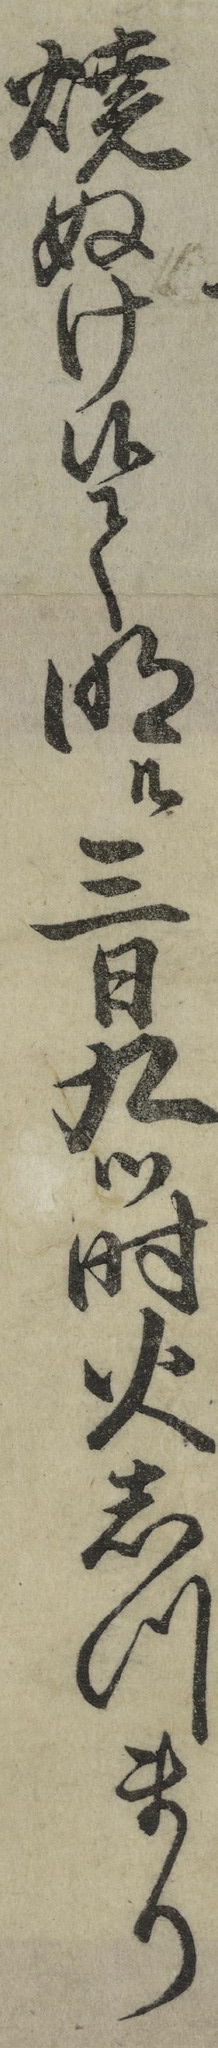焼ぬけ候て明る三日九ツ時火しづまり
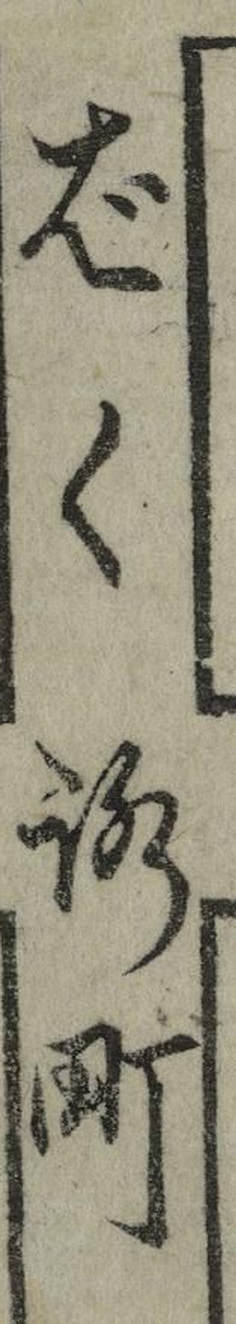ばく路町
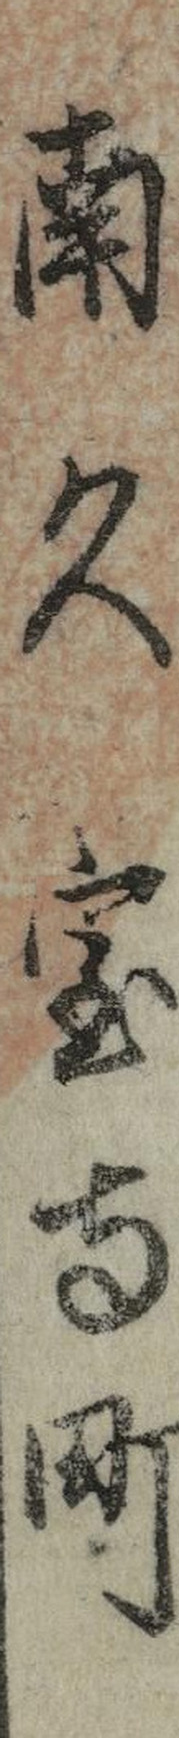北久宝寺町
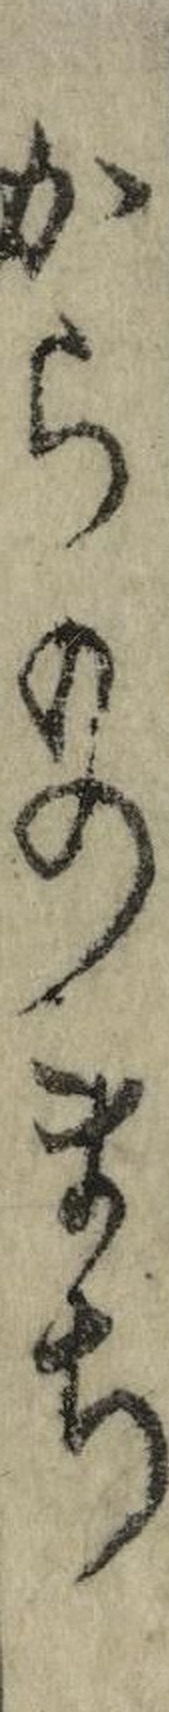からものまち
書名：[子二月の大坂大火に関する瓦版]
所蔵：東京大学地震研究所図書室 Earthquake Research Institute Library, The University of Tokyo, JAPAN
